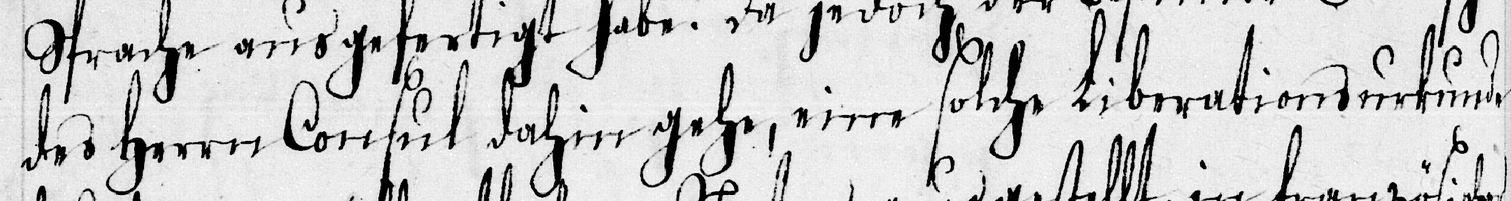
des Herrn Consul dahin gehe, eine solche Liberationsurkunde
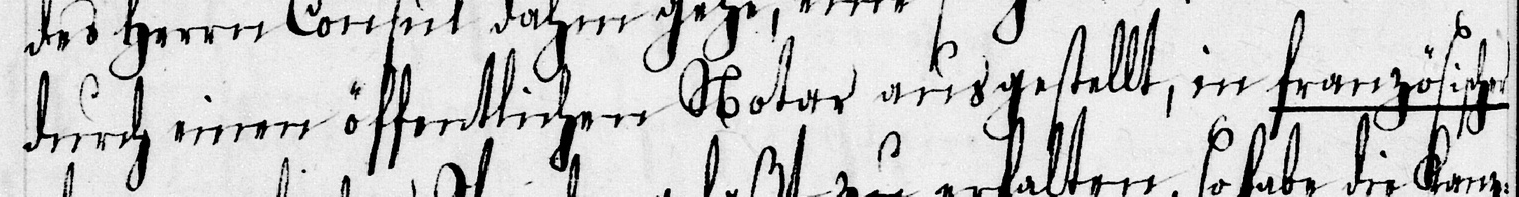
durch einen öffentlichen Notar ausgestellt, in französisc¬
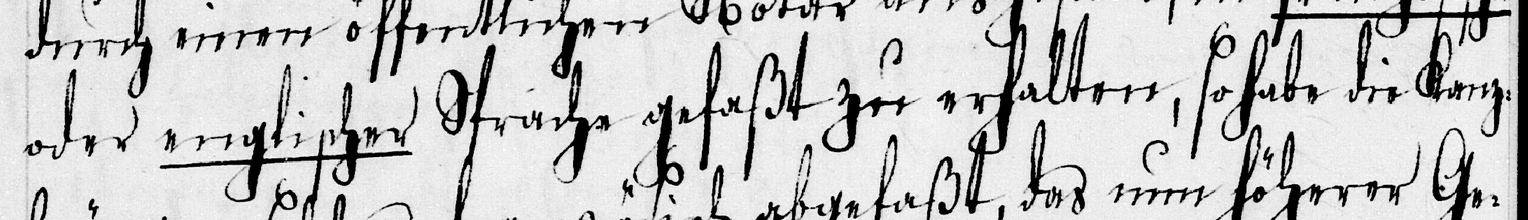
oder englischer Sprache gefaßt zu erhalten, so habe die Kan¬
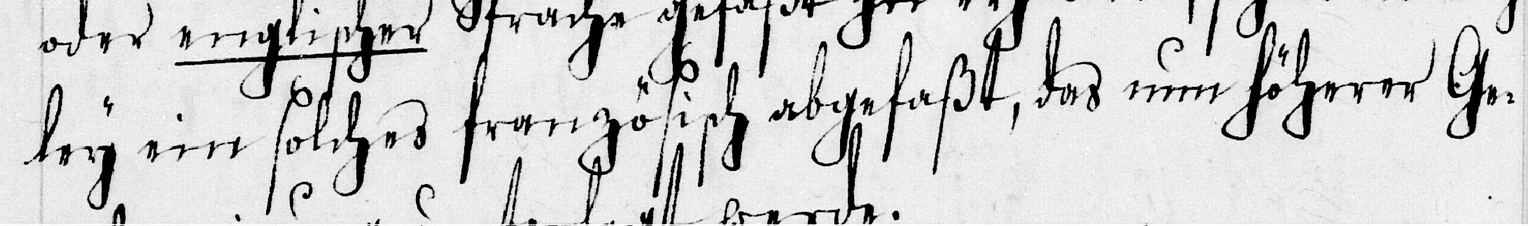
zley ein solches französisch abgefaßt, das nun höherer Ge¬
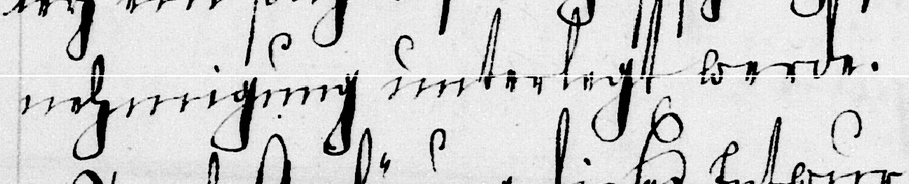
nehmigung unterlegt werde.
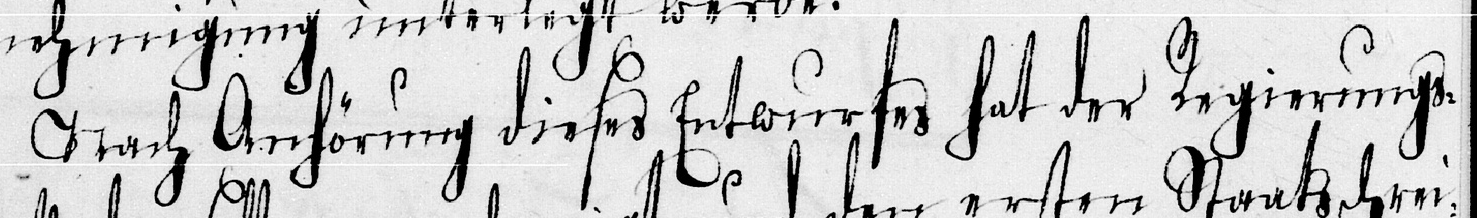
Nach Anhörung dieses Entwurfes hat der Regierungs¬
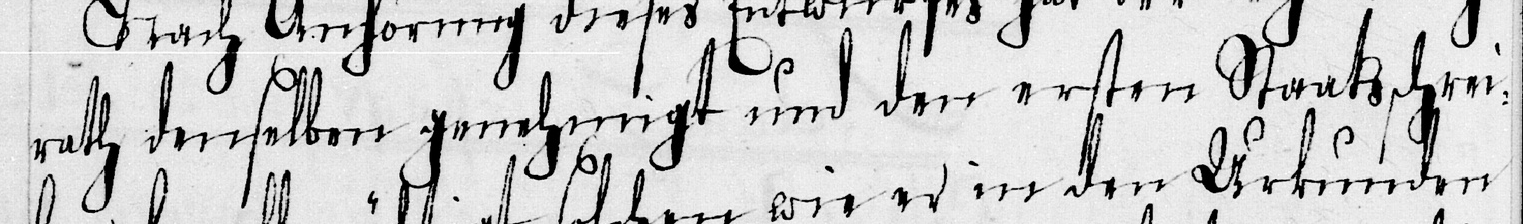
rath denselben genehmigt und den ersten Staatsschre¬
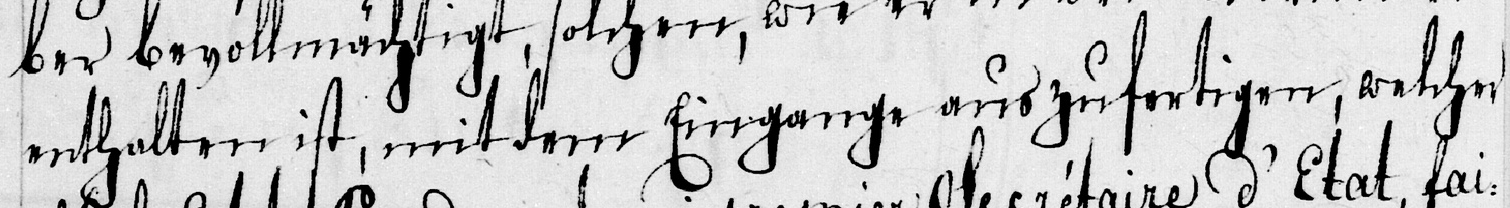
enthalten ist, mit dem Eingange auszufertigen, welcher
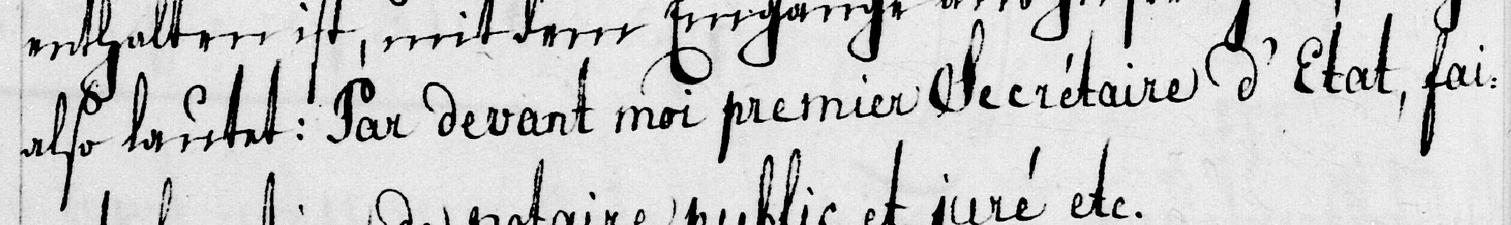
also lautet: Par devant moi premier Secrétaire d’Etat, fai¬
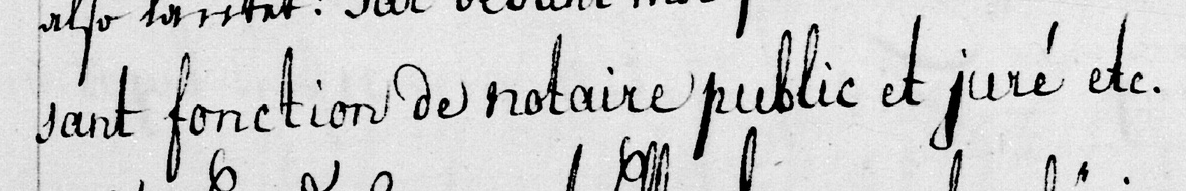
sant fonction de notaire public et juré etc.
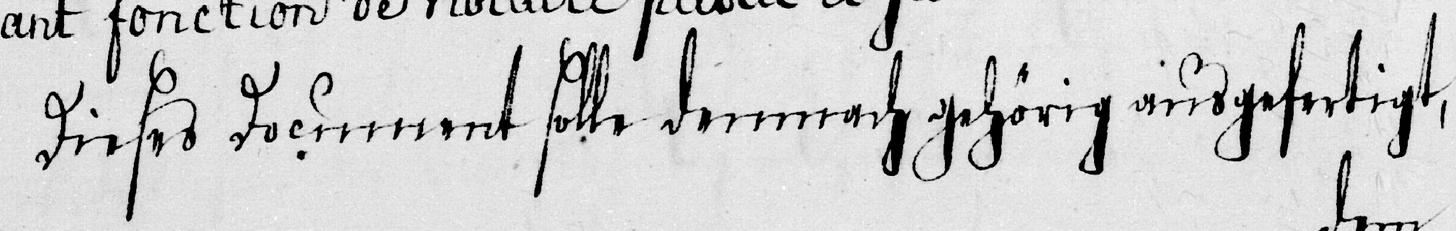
Dieses Document solle demnach gehörig ausgefertigt,
